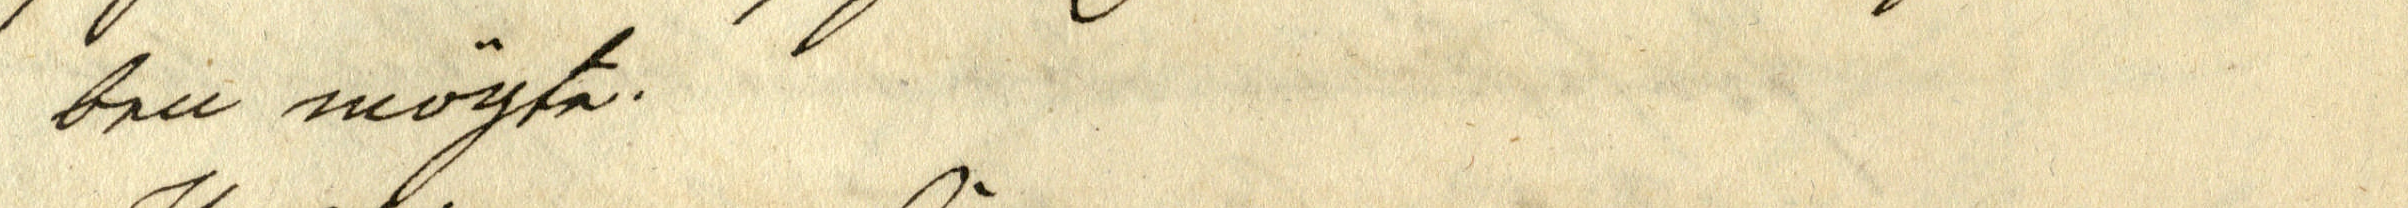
ben mögte.
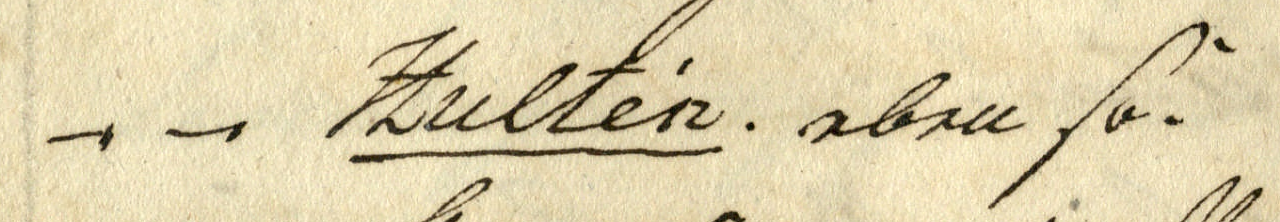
- " - " Hultén. eben so.
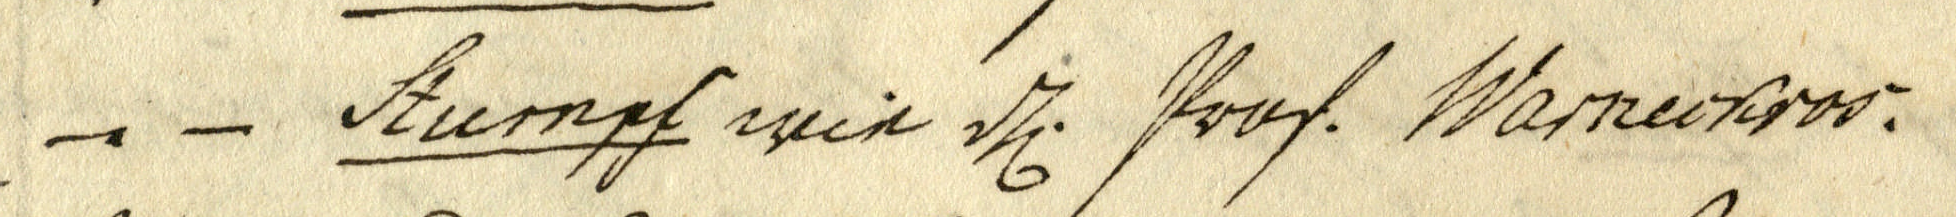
- " - Stumpf wie dh. Prof. Warneckros.
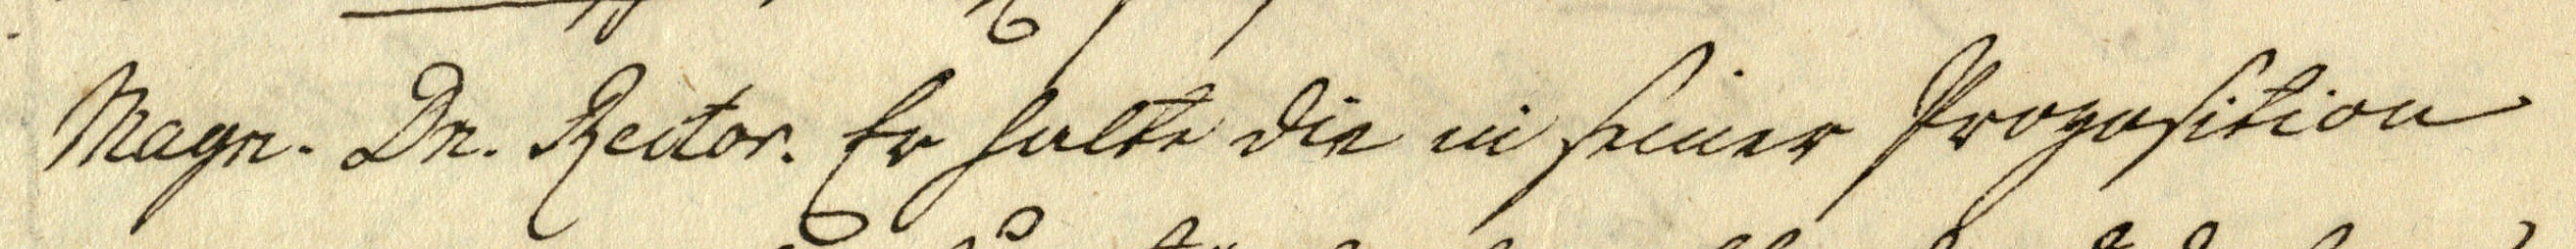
Magn. Dn. Rector. Er halte die in seiner Proposition
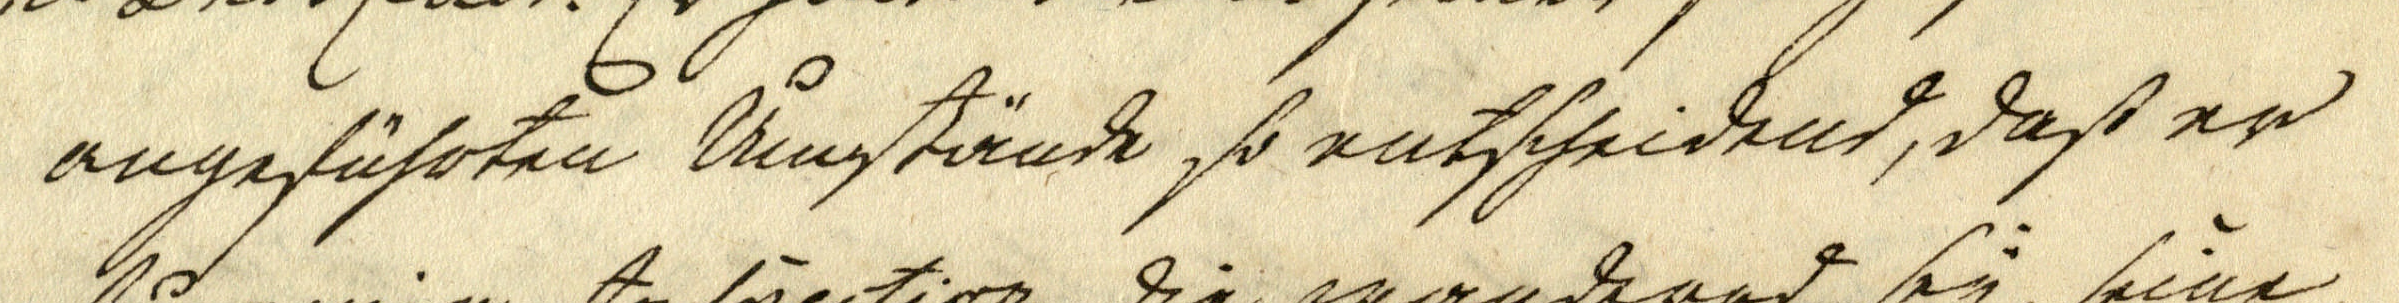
angeführten Umstände so entscheidend, daß er
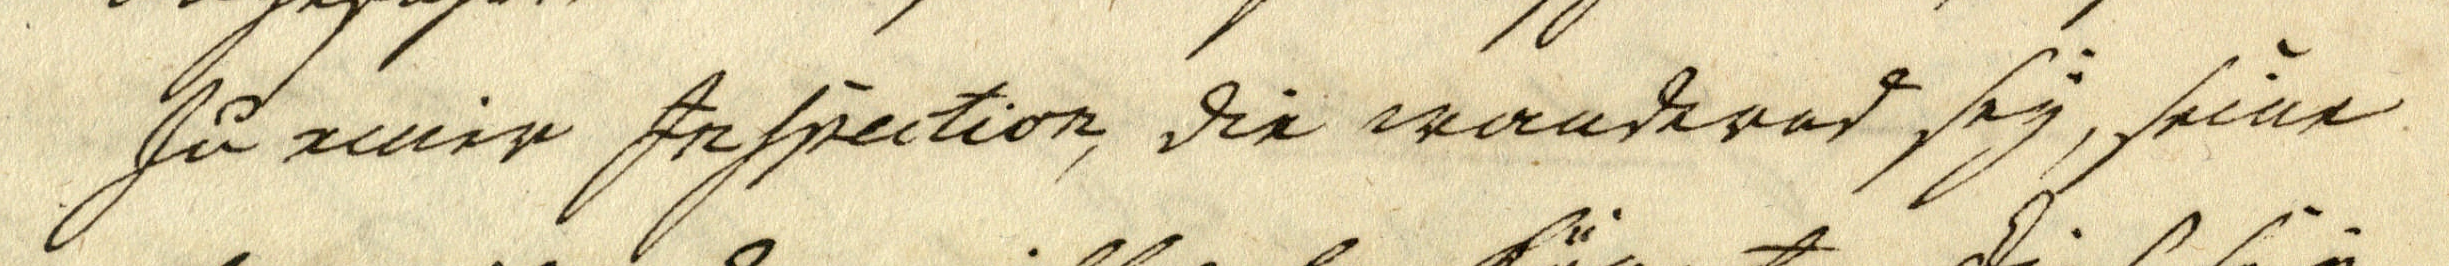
zu einer Inspection, die wandernd sey, seine
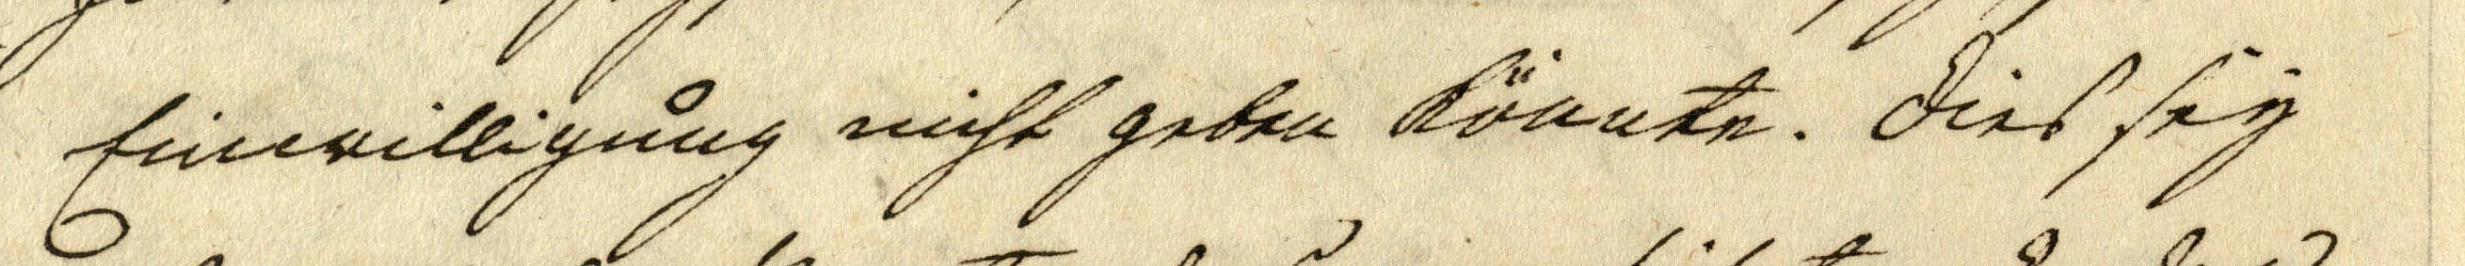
Einwilligung nicht geben könnte. Dies sey
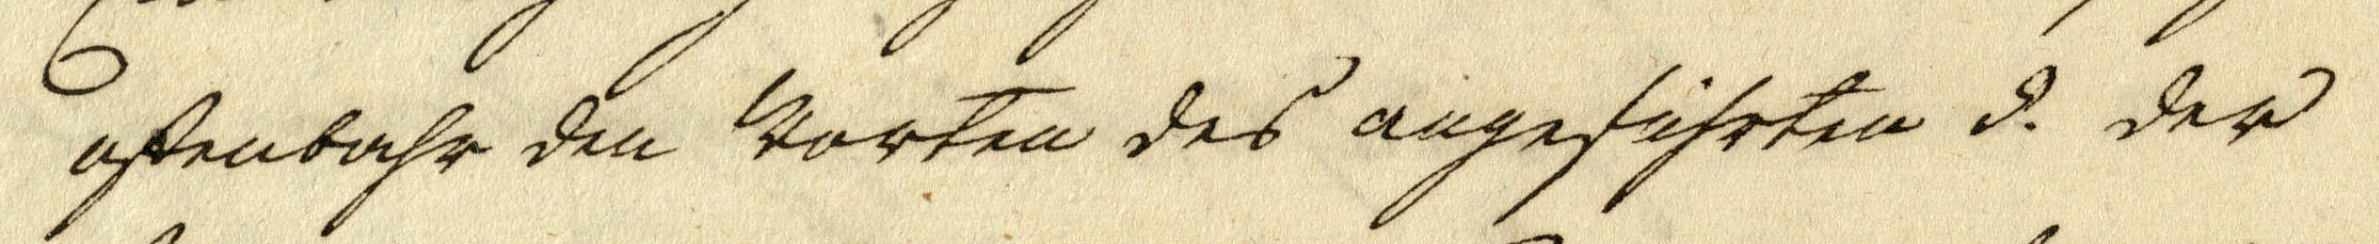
offenbahr den Worten des angeführten § der
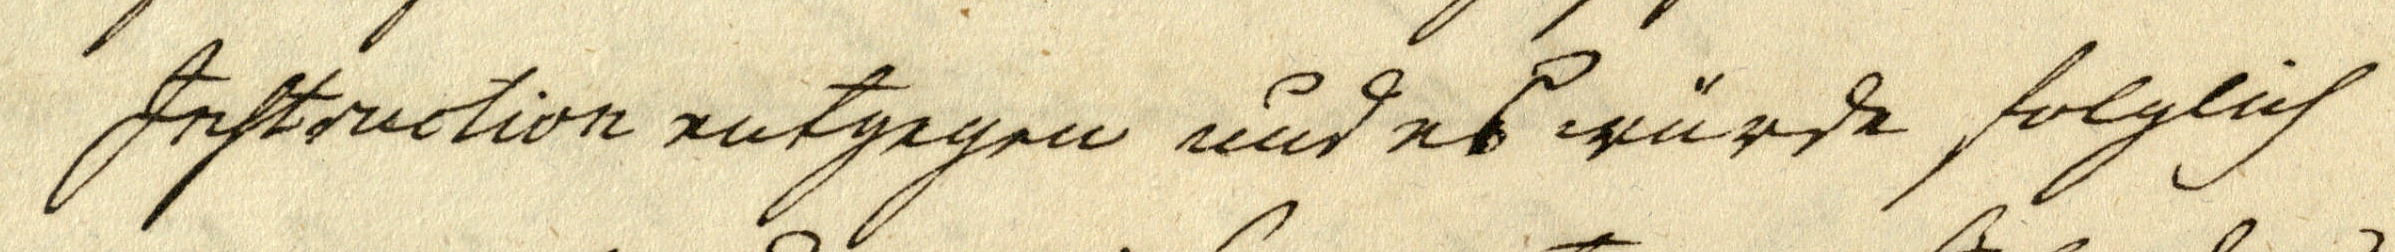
Instruction entgegen und es würde folglich
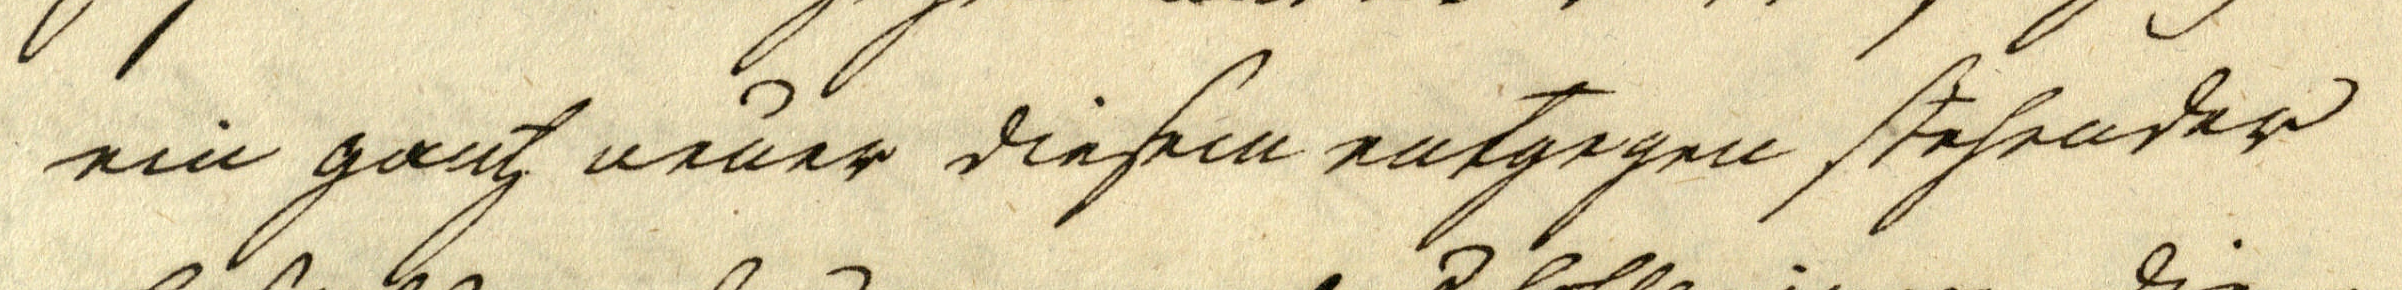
ein gantz neuer diesem entgegen stehender
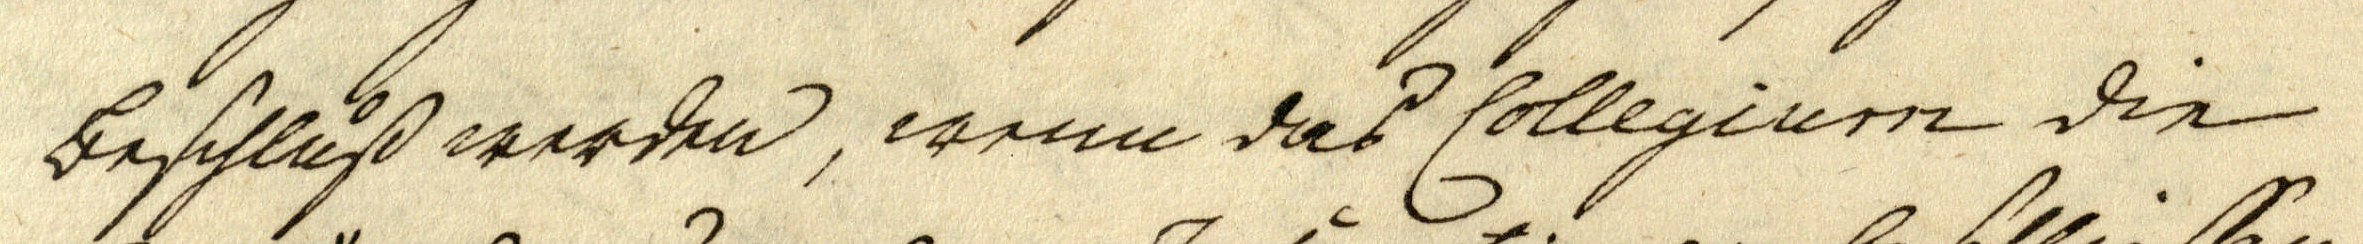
Beschluß werden, wenn das Collegium die
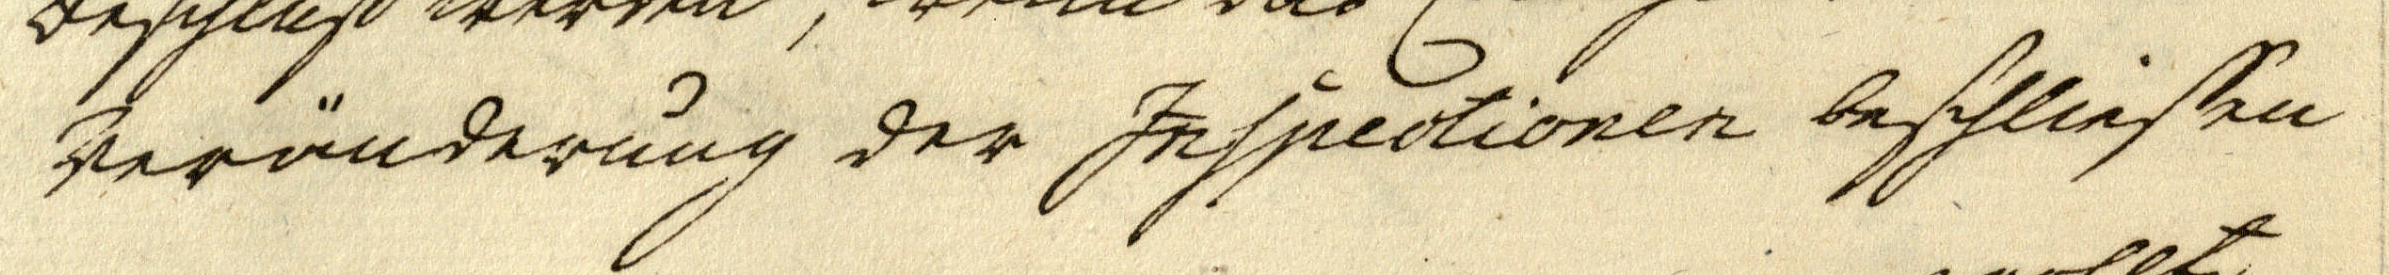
Veränderung der Inspectionen beschliessen
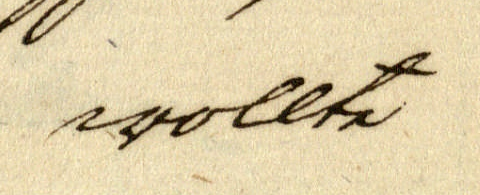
wollte
